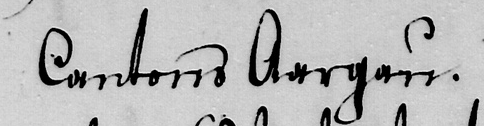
Cantons Aargau.
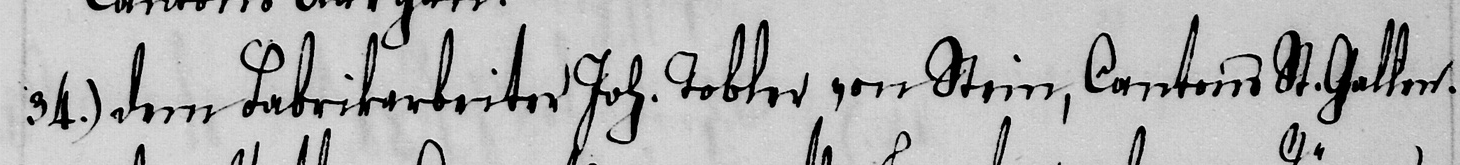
34.) dem Fabrikarbeiter Joh. Tobler von Stein, Cantons St. Gallen.
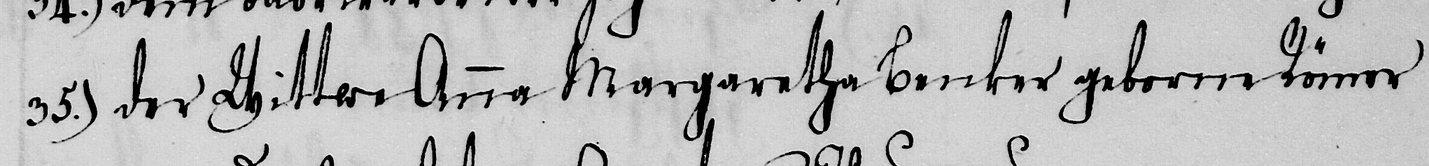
35.) der Wittwe Anna Margaretha Benker geborene Römer
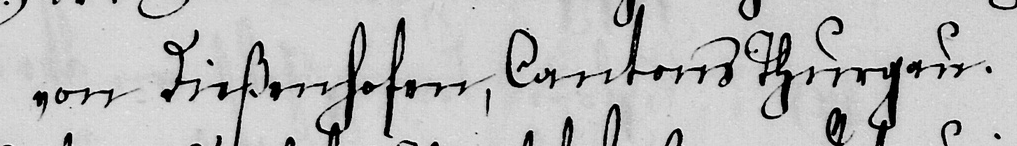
von Dießenhofen, Cantons Thurgau.
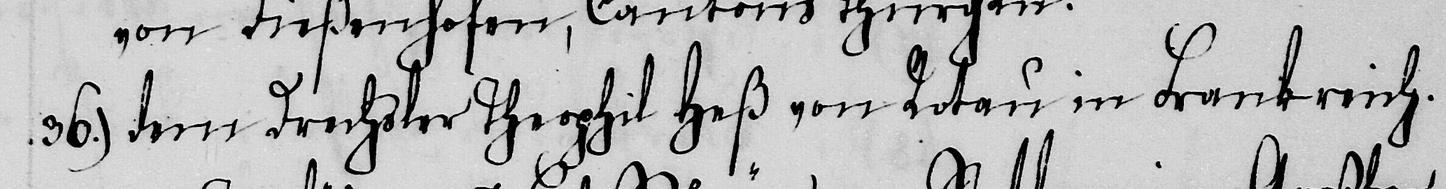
36.) dem Drechsler Theophil Heß von Rotau in Frankreich.
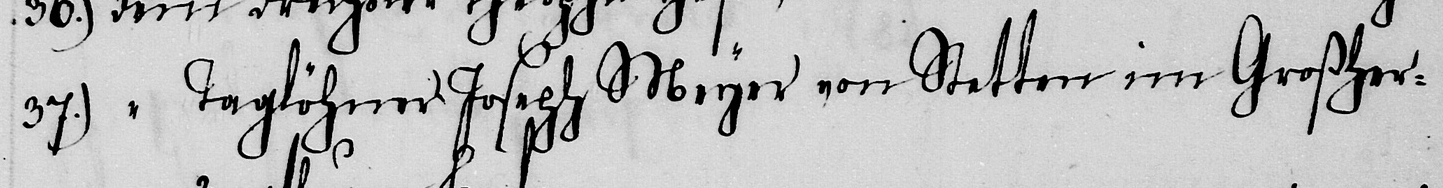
37.) “ Taglöhner Joseph Meyer von Stetten im Großher¬
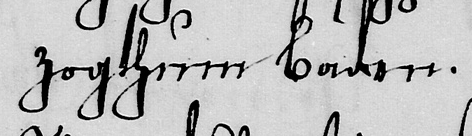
zogthum Baden.
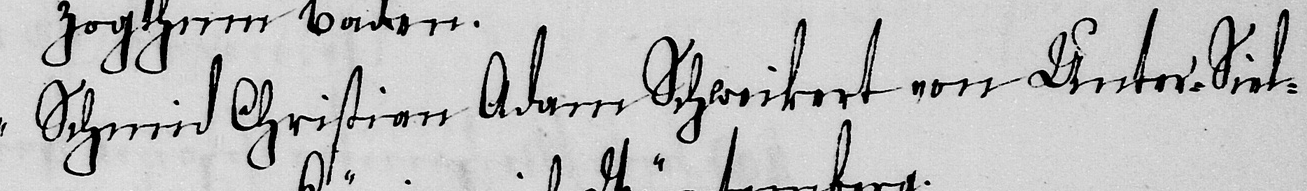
Schmid Christian Adam Schweikert von Unter-Siel¬
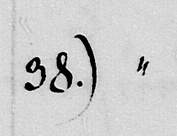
38.) “
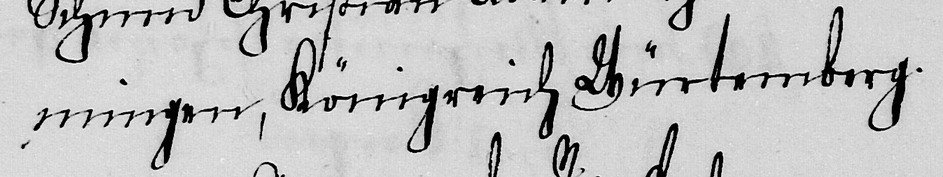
mingen, Königreich Würtemberg.
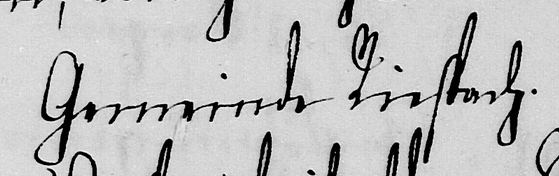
Gemeinde Riespach.
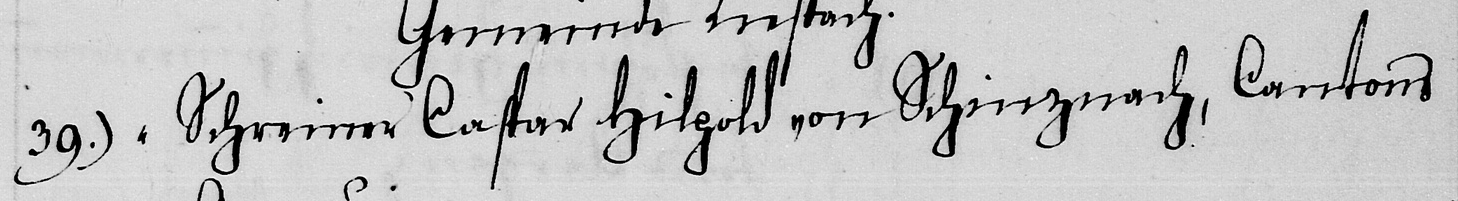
39.) “ Schreiner Caspar Hilgold von Schinznach, Cantons
